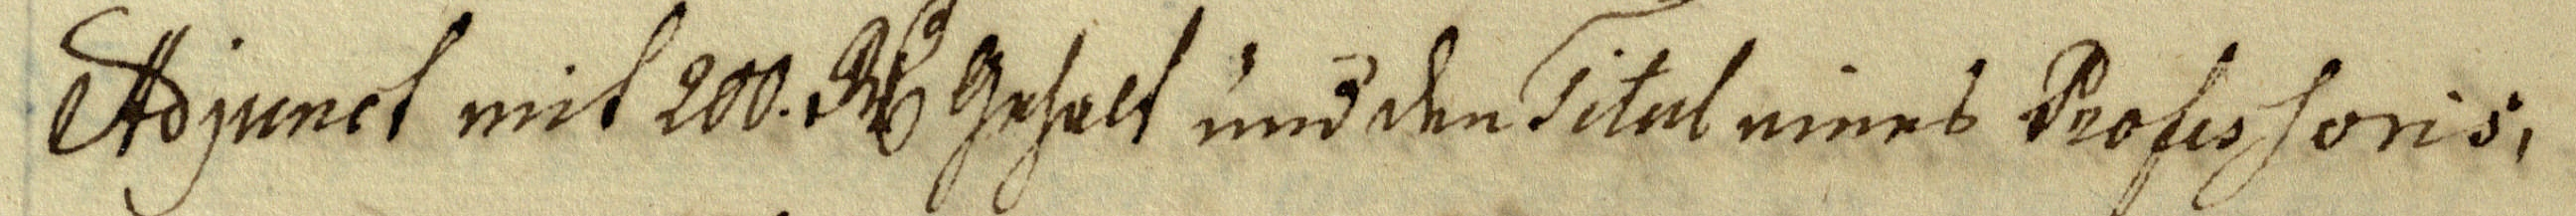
Adjunct mit 200 Rt. Gehalt und den Titul eines Professoris,
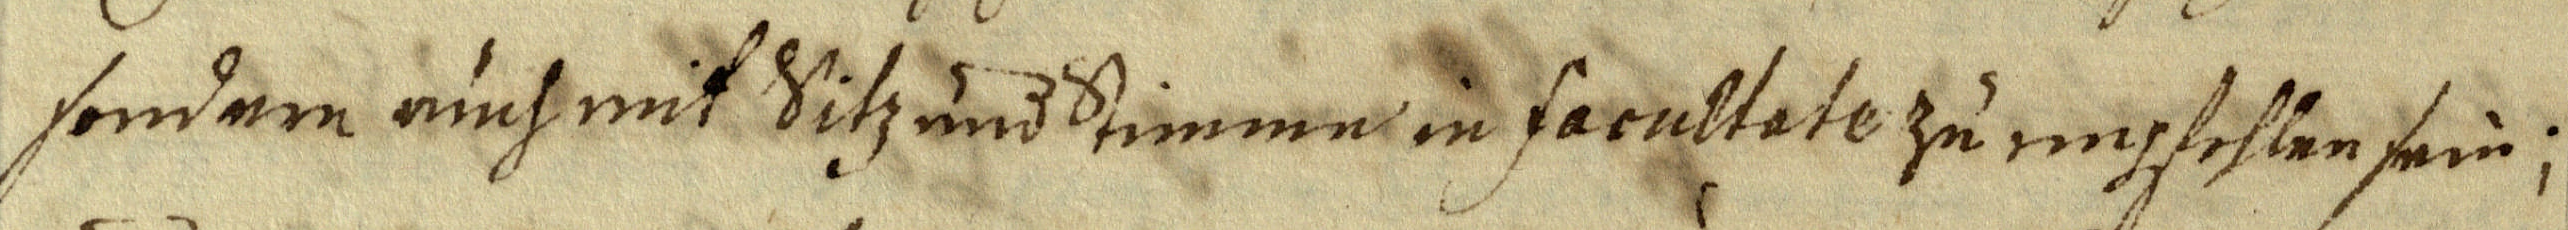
sondern auch mit Sitz und Stimme in Facultate zu empfehlen sein;
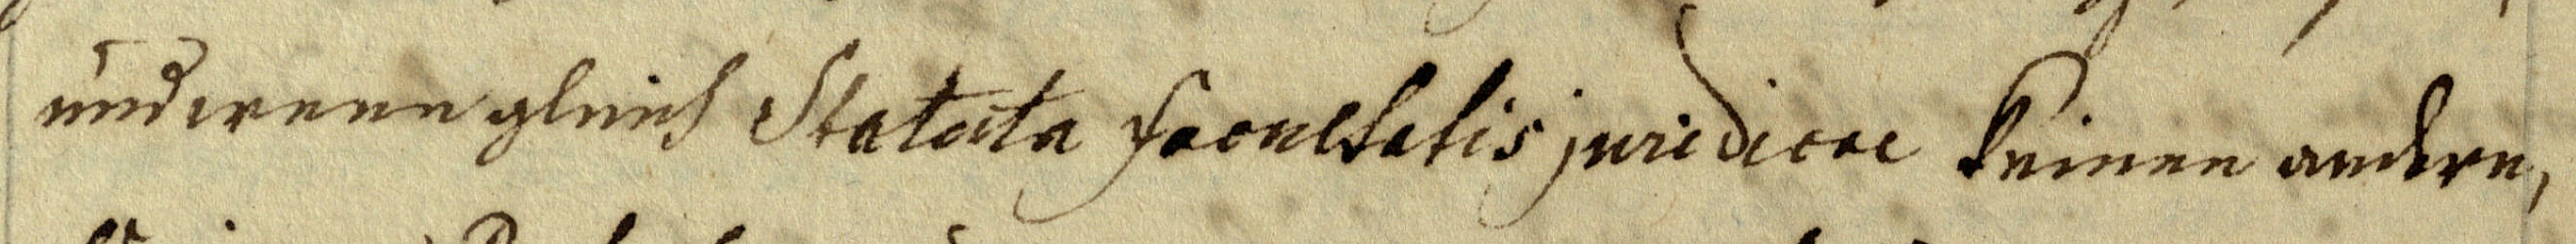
und wenngleich Statuta Facultatis juridicae keinen andern,
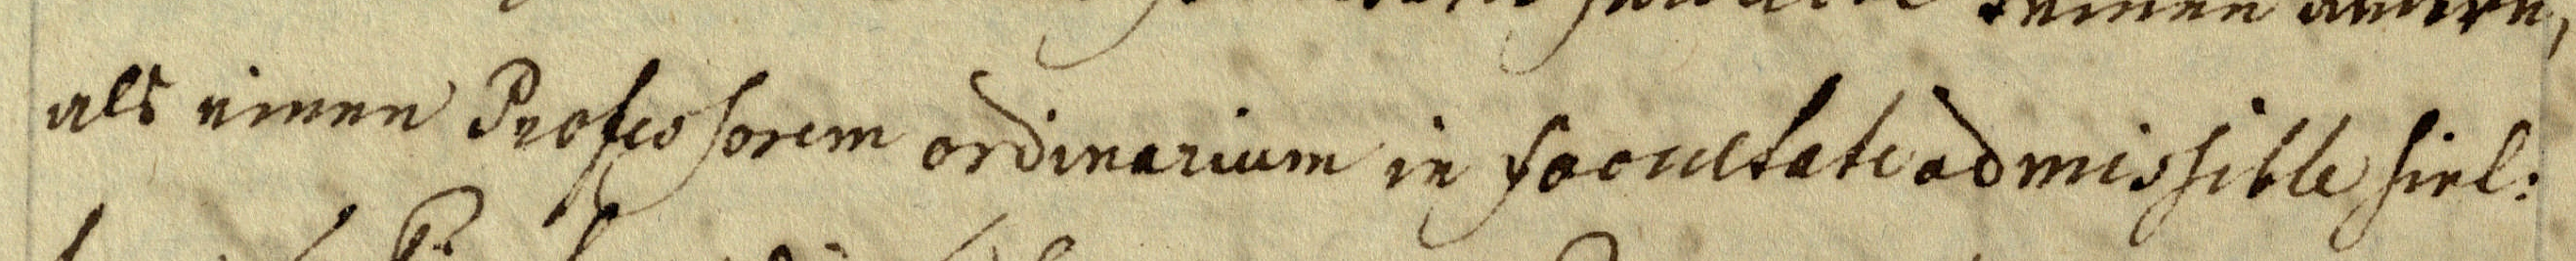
als einen Professorem ordinarium in facultati admissible hiel¬
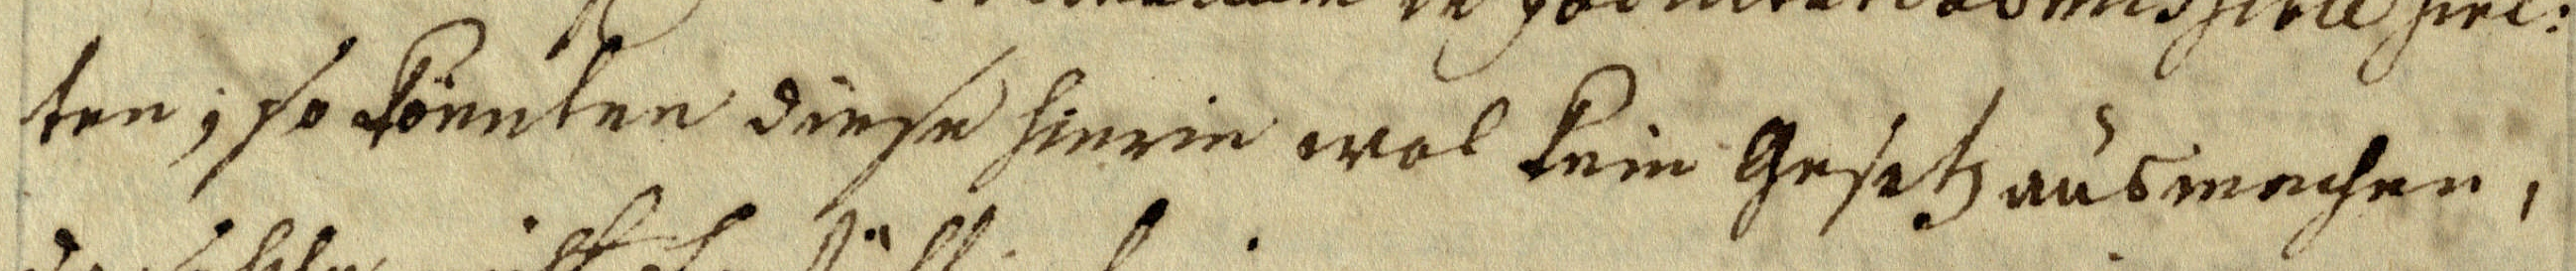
ten, so könnten diese hierin wol kein Gesetz ausmachen,
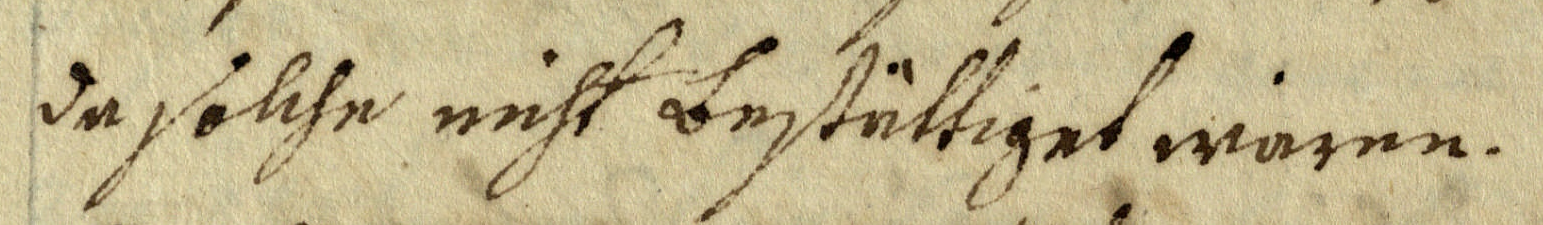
da solche nicht bestättiget wären.
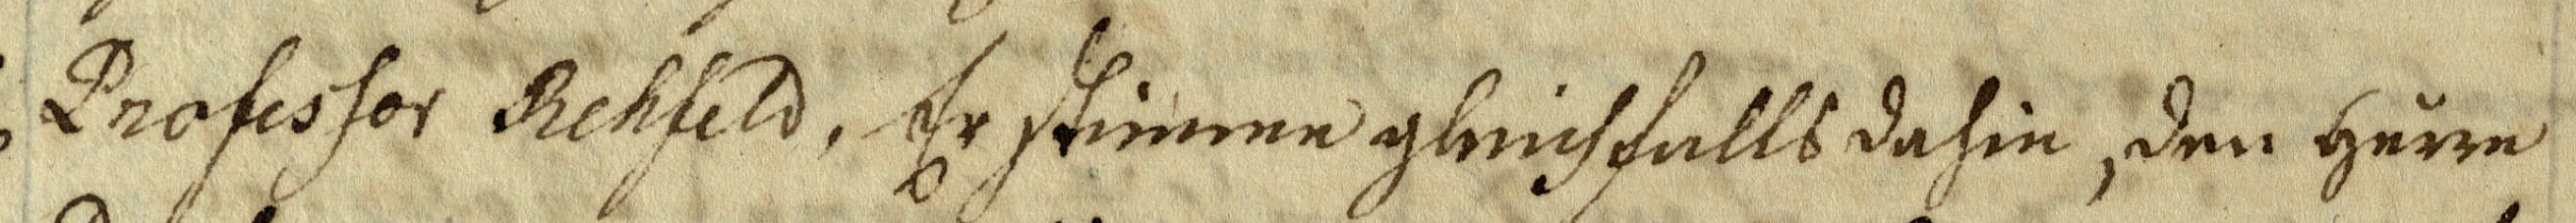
dH Professor Rehfeld, Er stimme gleich falls dahin, den Herrn
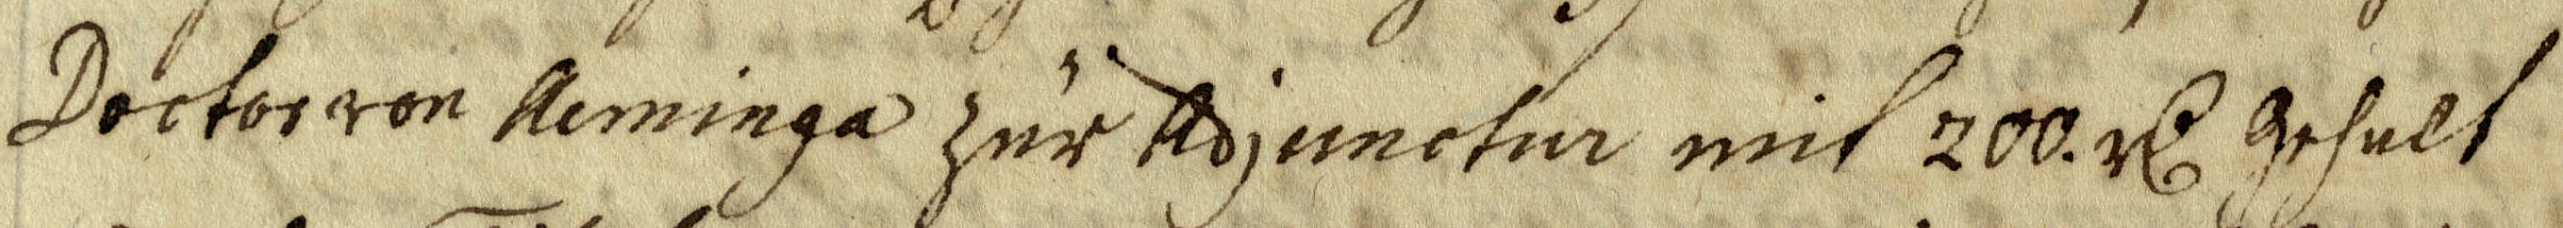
Doctor von Aeminga zur Adjunctur mit 200 rl. Gehalt
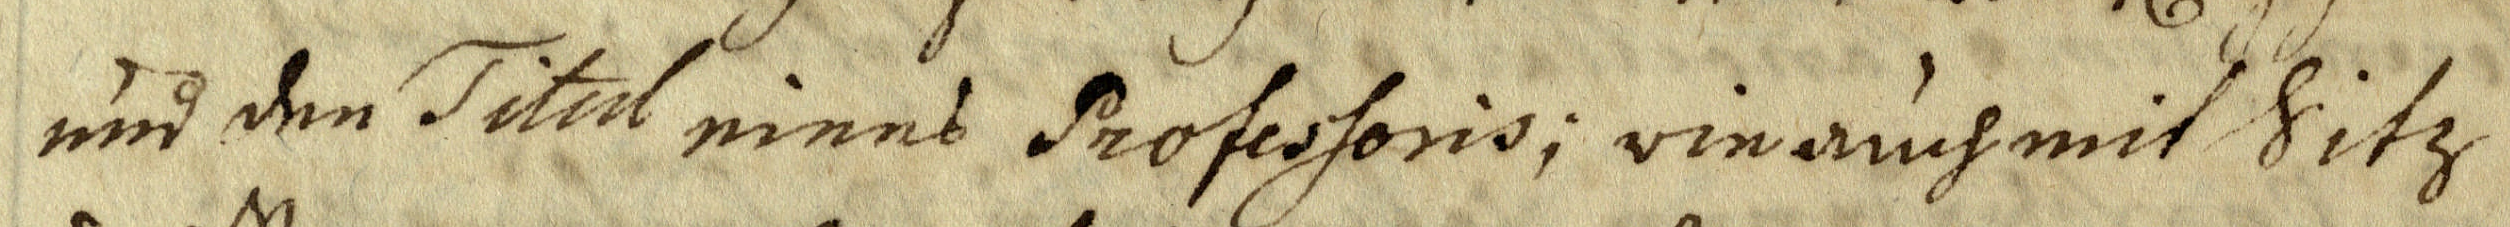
und den Titul eines Professoris; wie auch mit Sitz
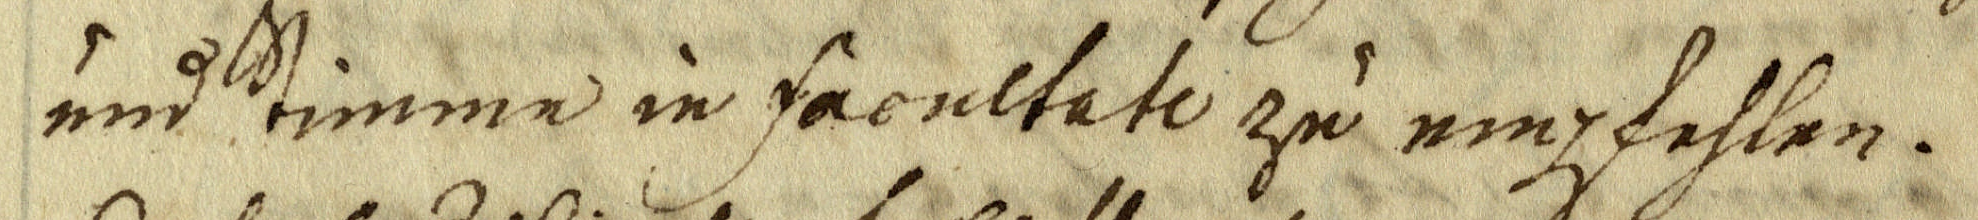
und Stimme in Facultate zu empfehlen.
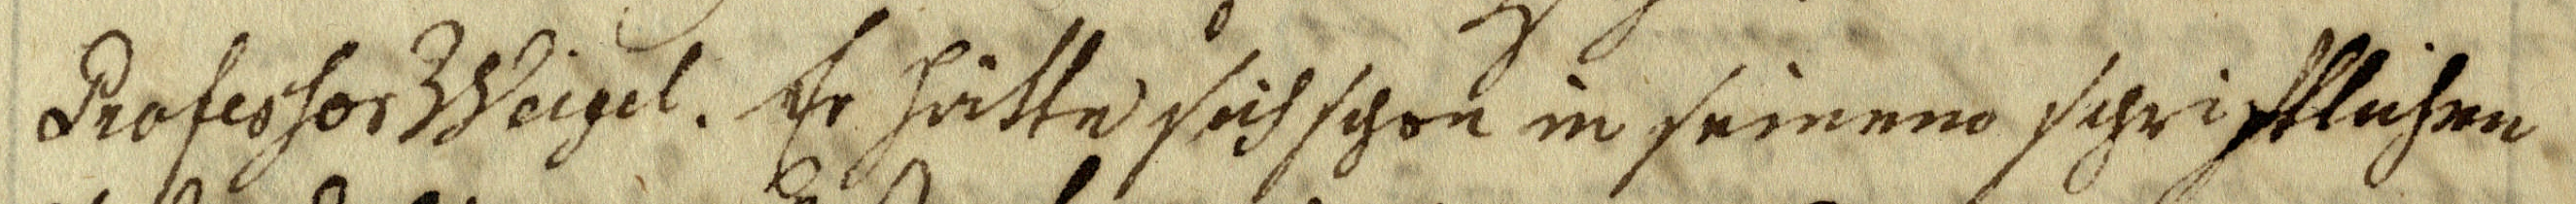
dh Professor Weigel. Er hätte sich schon in seinem schriftlichen
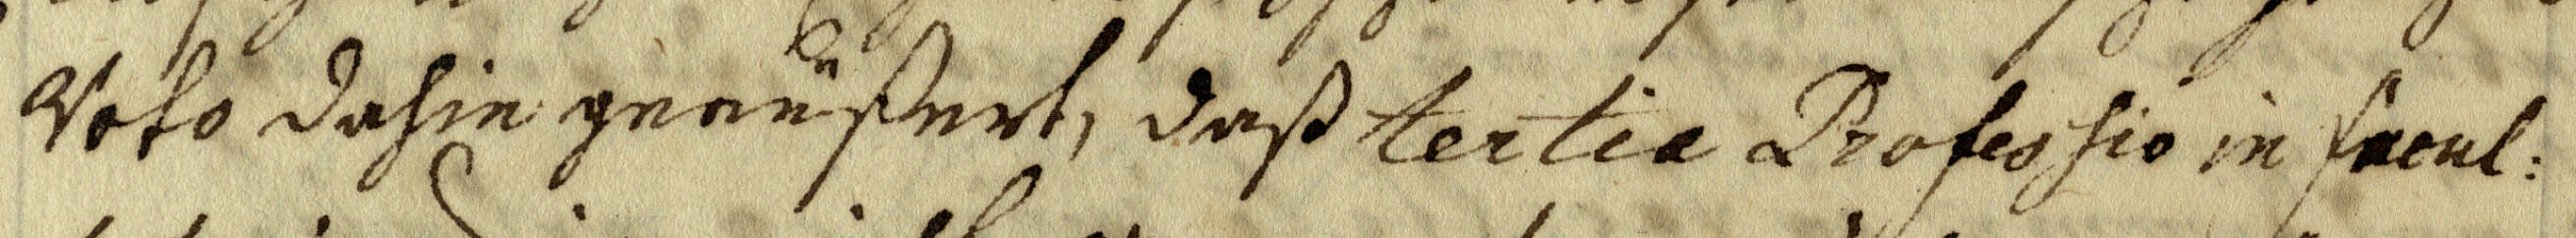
Voto dahin geäußert, daß tertia Professio in Facul¬
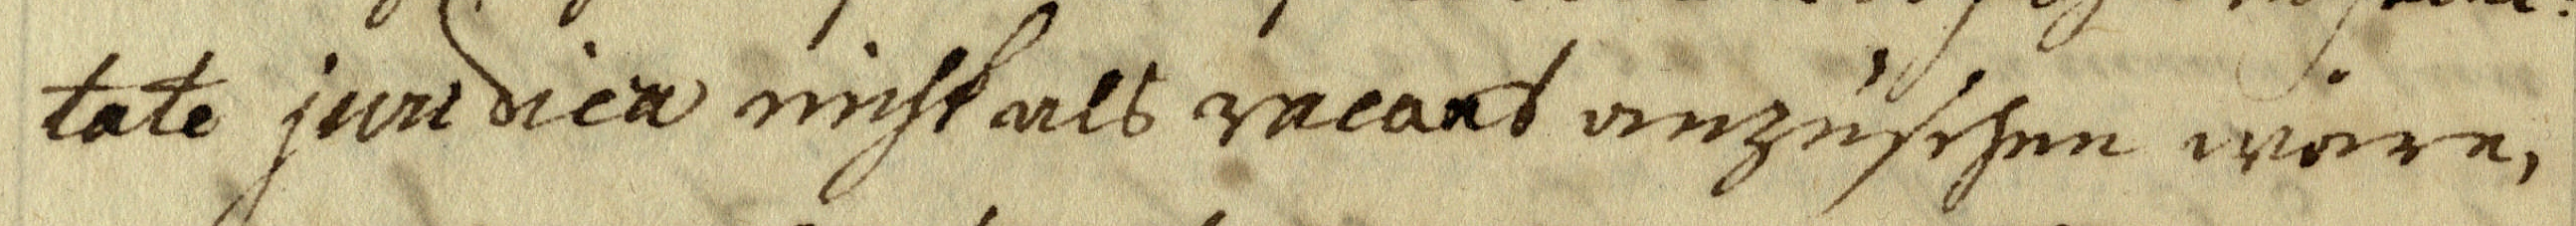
tate juridica nicht als vacant anzusehen wäre,
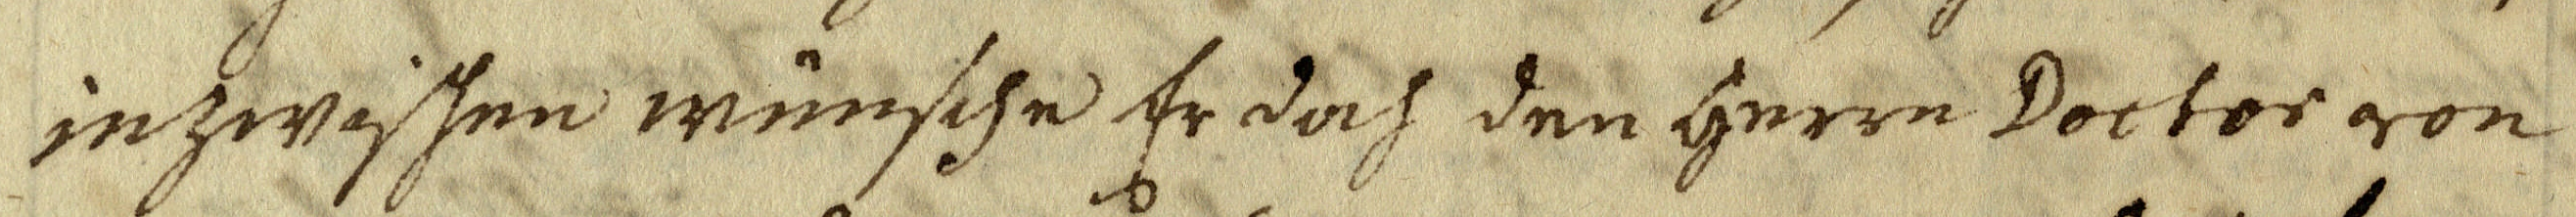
inzwischen wünsche Er doch den Herrn Doctor von
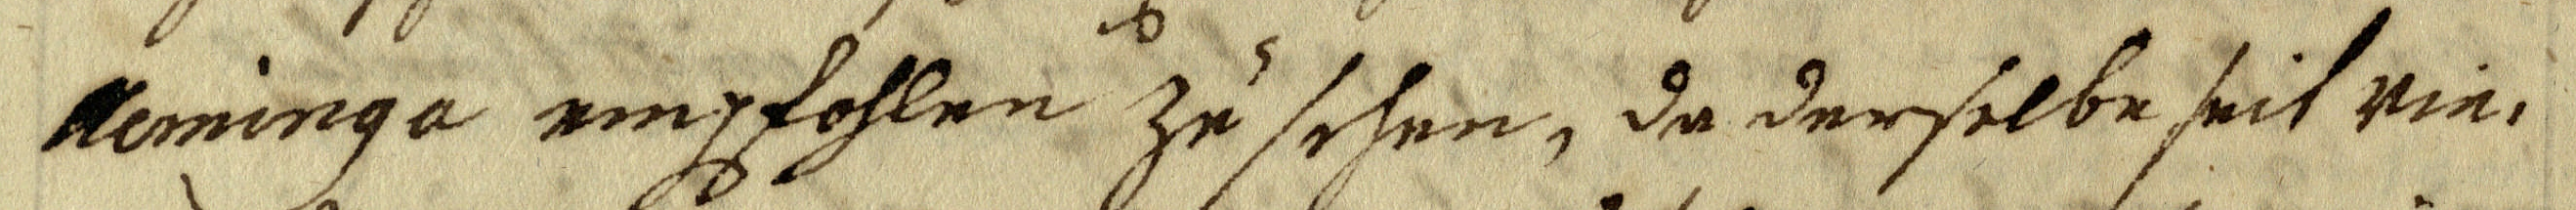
Aeminga empfohlen zu sehen, da derselbe seit vie¬
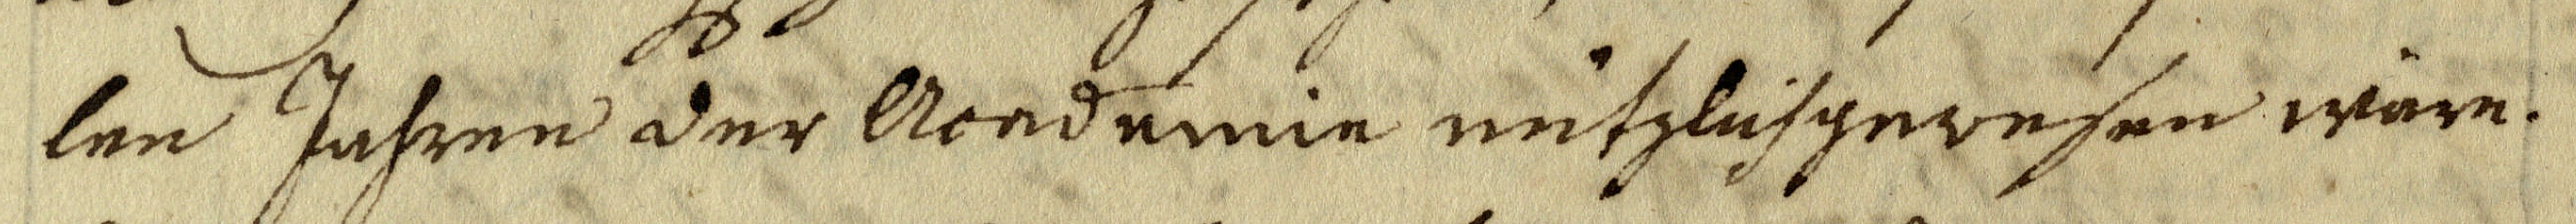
len Jahren der Academie nützlich gewesen wäre.
